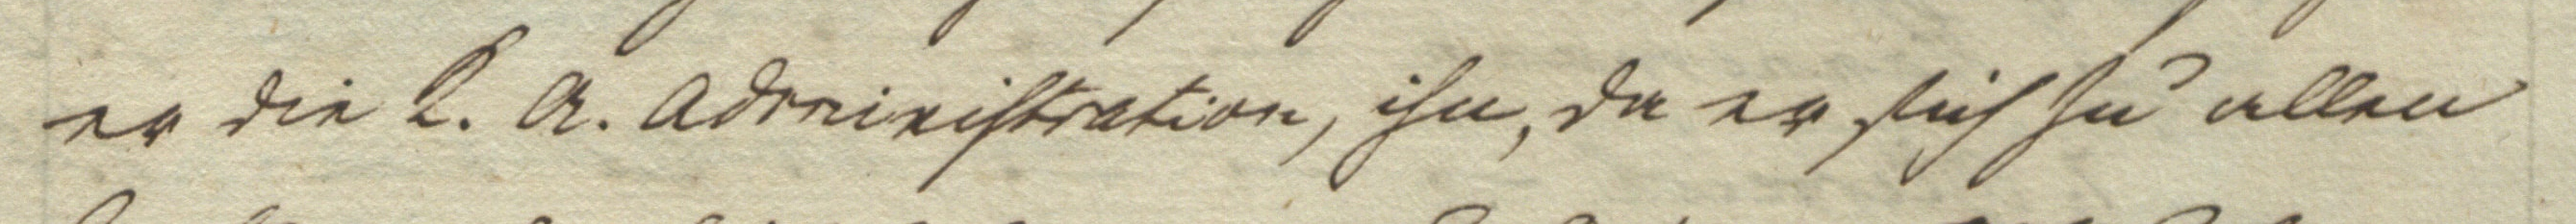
er die K. A. Administration, ihn, da er sich zu allen
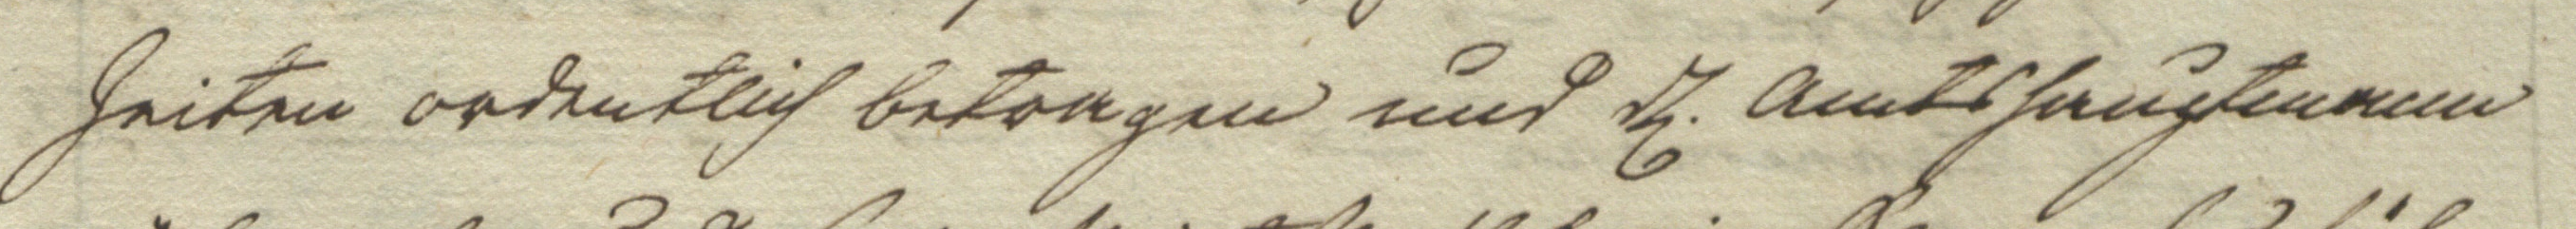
Zeiten ordentlich betragen und dh. Amtshauptmann
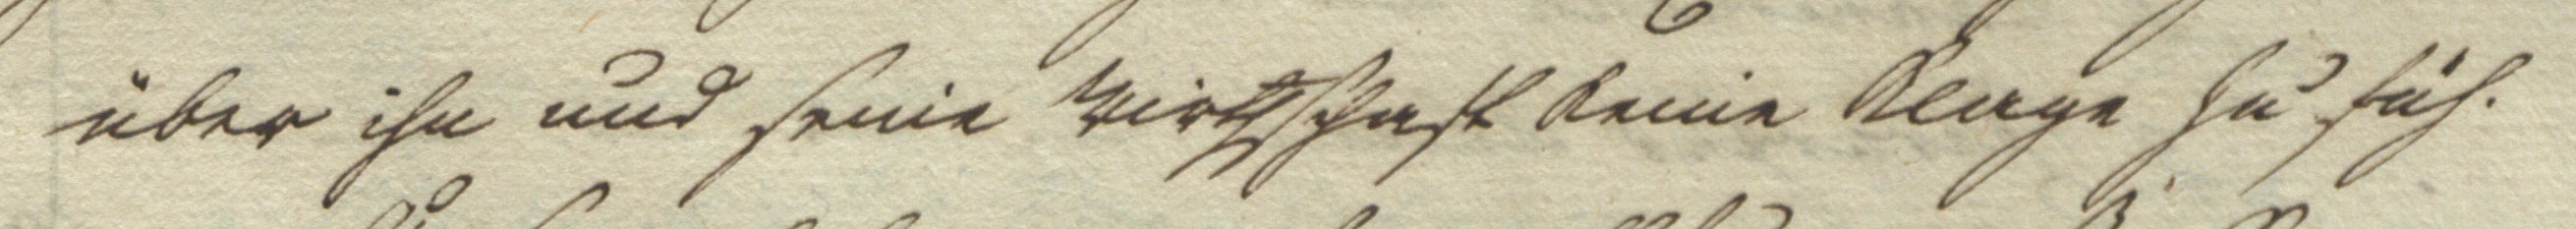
über ihn und seine Wirthschaft keine Klage zu füh¬
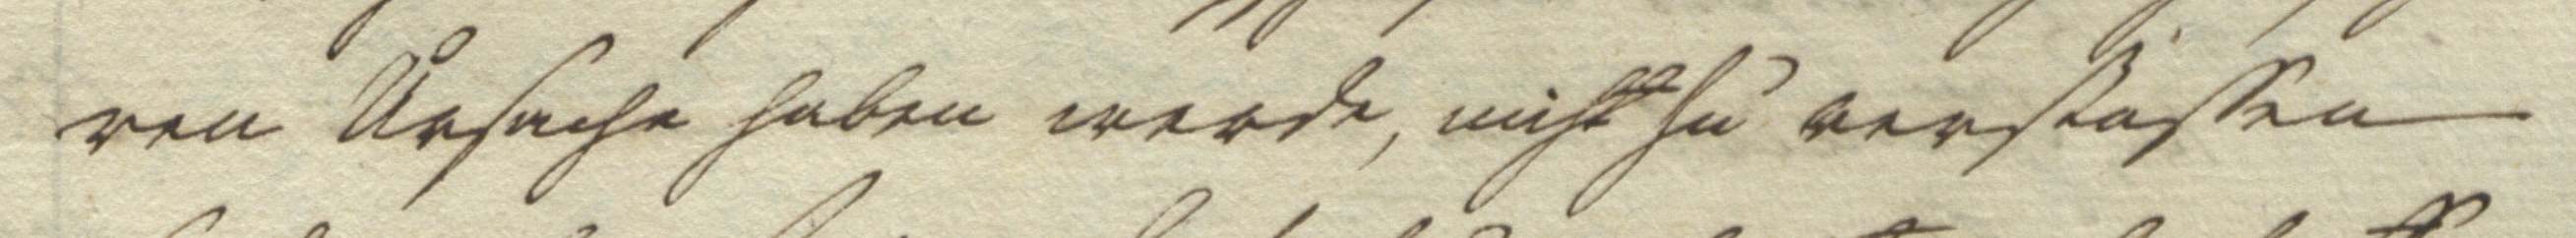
ren Ursache haben werde, nicht zu verstossen
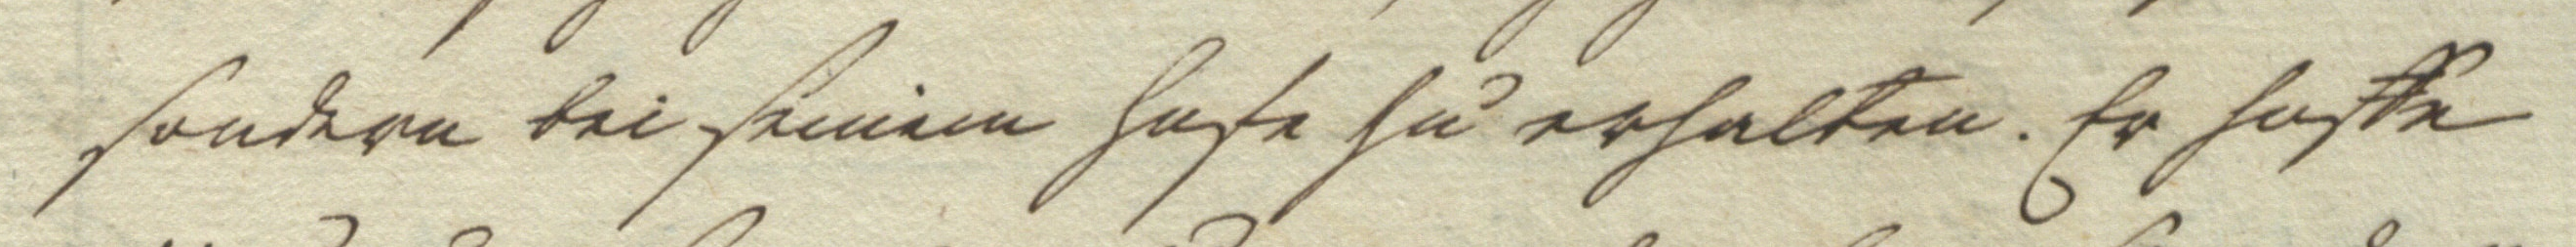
sondern bei seinem Hofe zu erhalten. Er hoffe
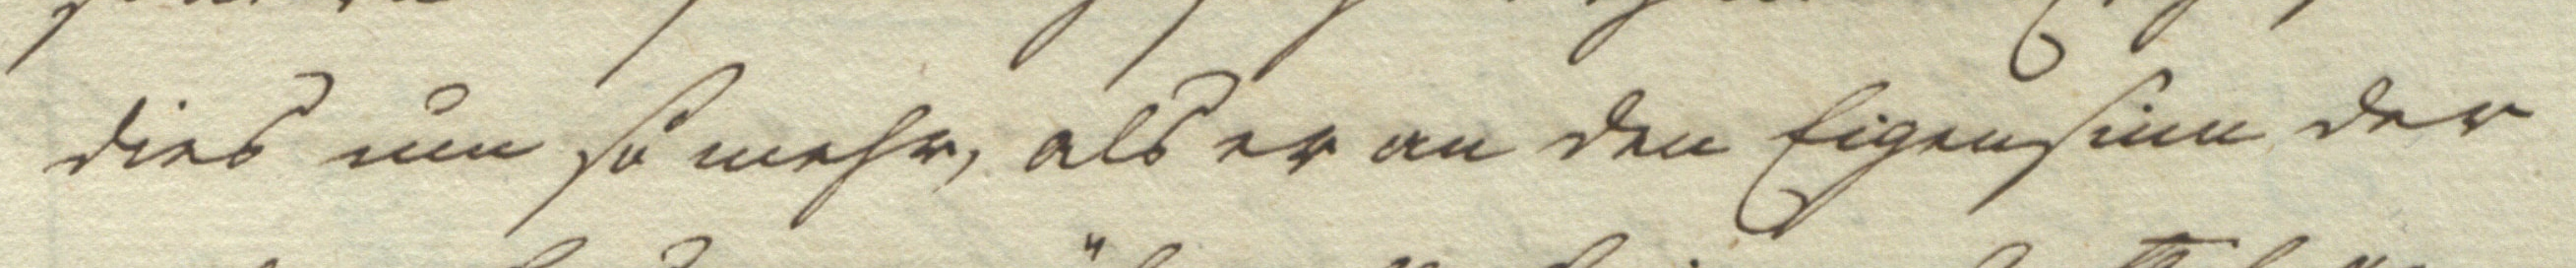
dies um so mehr, als er an den Eigensinn der
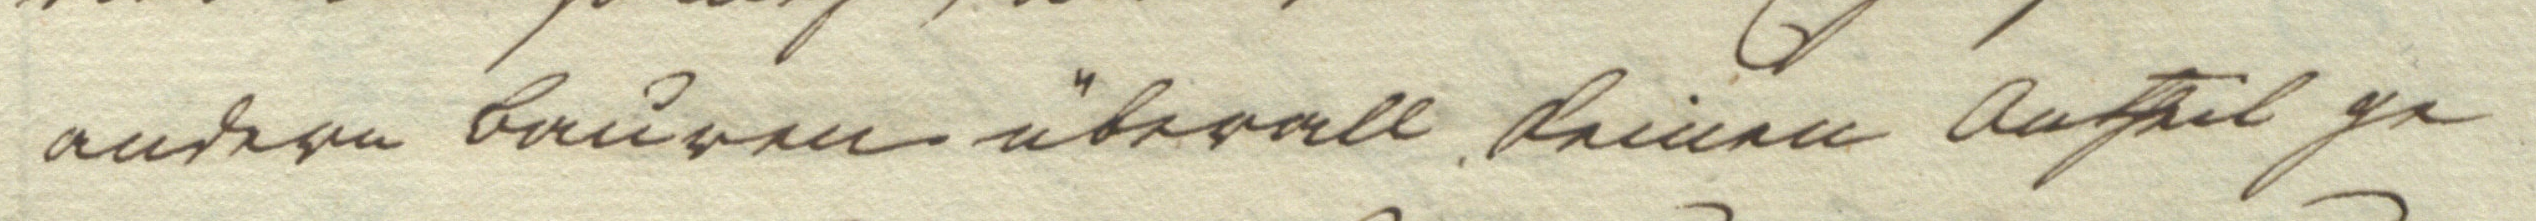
andern Bauren überall keinen Antheil ge¬
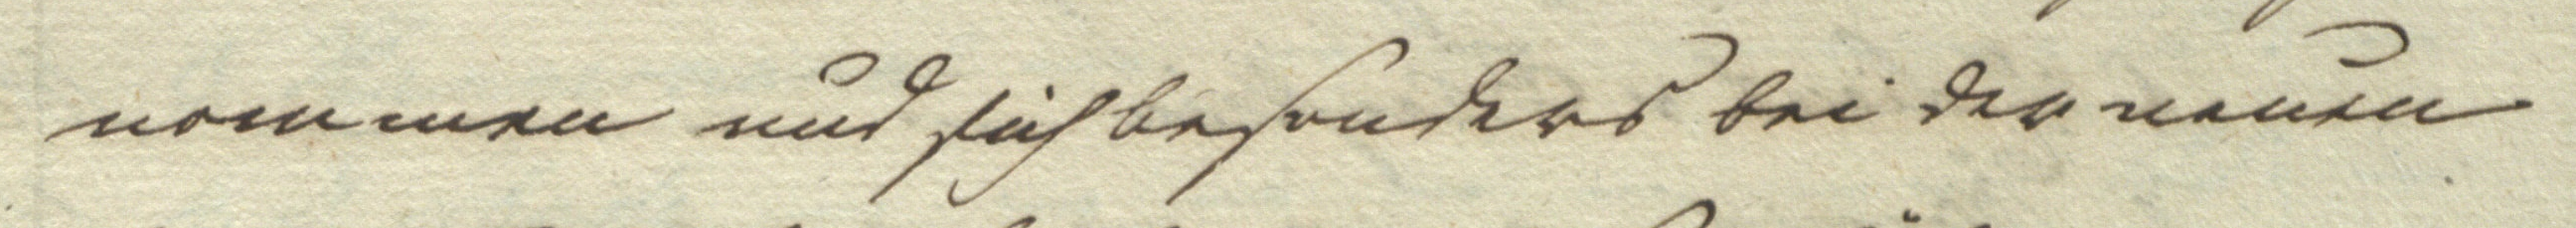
nommen und sich besonders bei der neuen
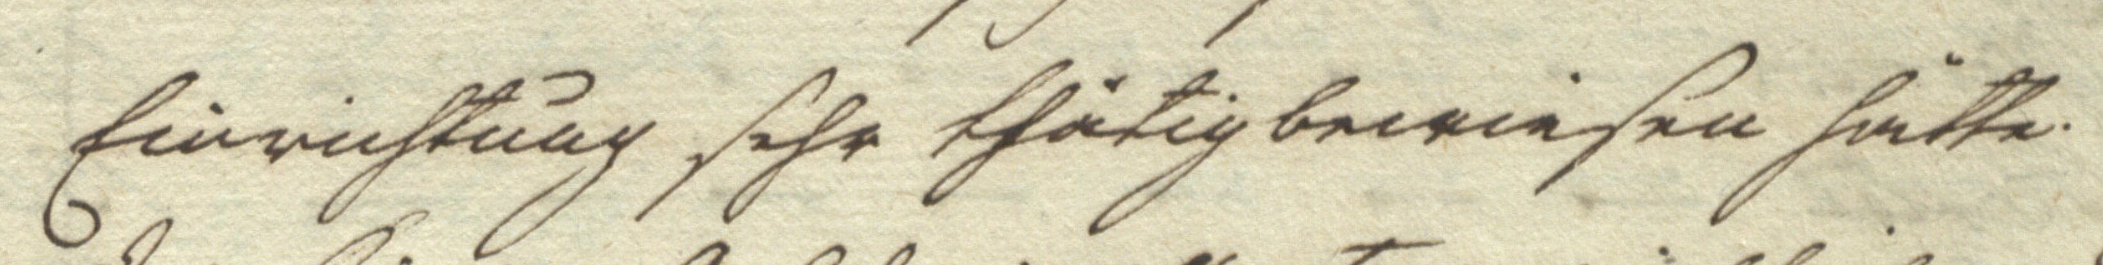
Einrichtung sehr thätig bewiesen hätte.
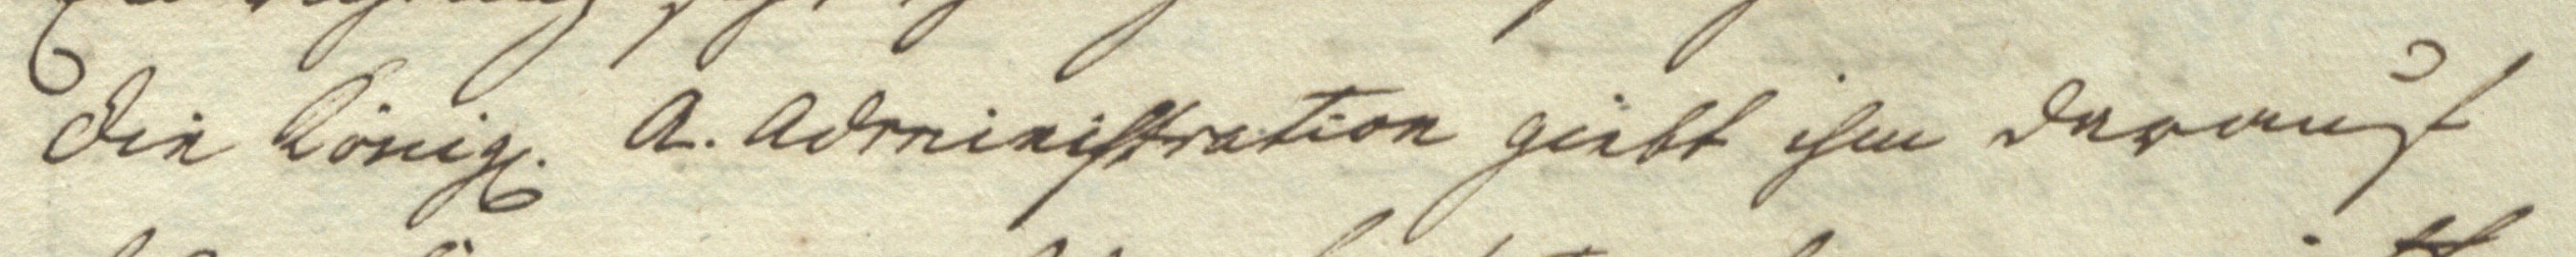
Die Königl. A. Administration giebt ihm darauf
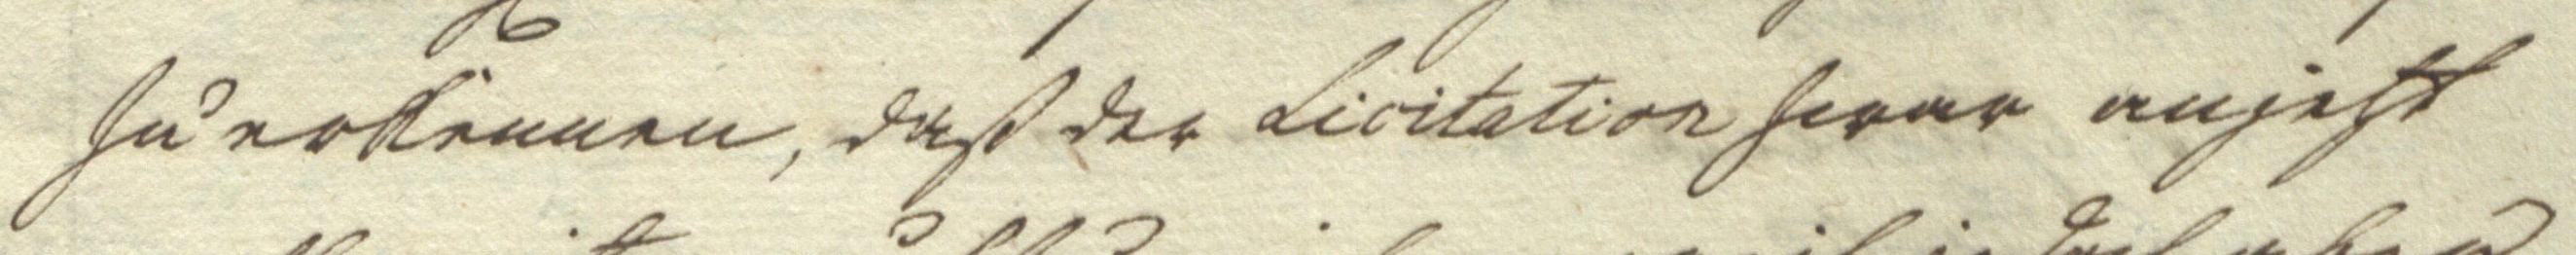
zu erkennen, daß der Licitation zwar anjetzt
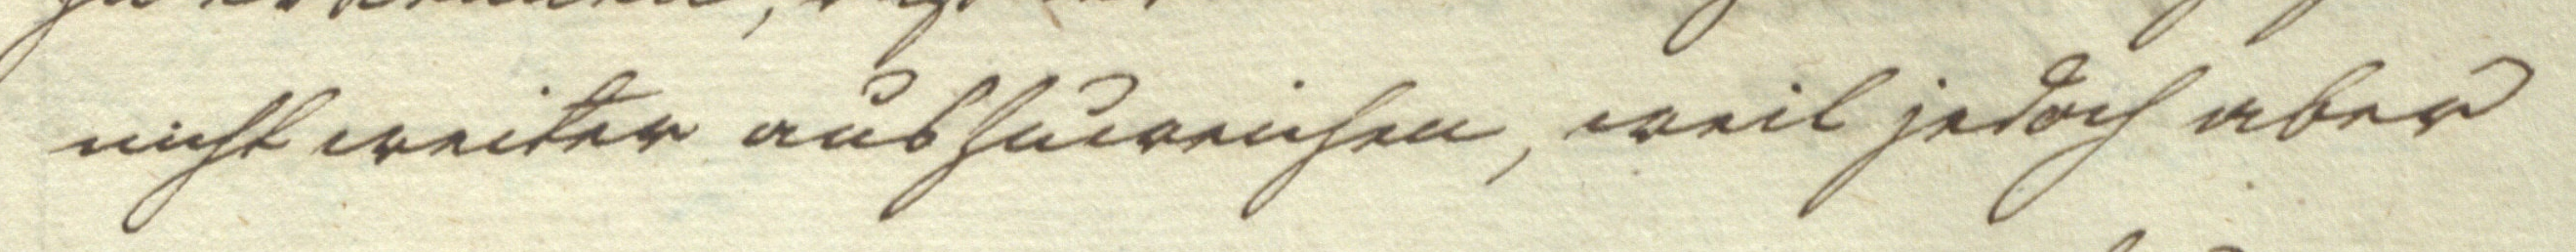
nicht weiter auszuweichen, weil jedoch aber
